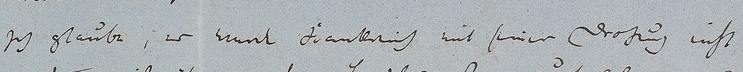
Ich glaube, es werde Frankreich mit seiner Drohung nicht
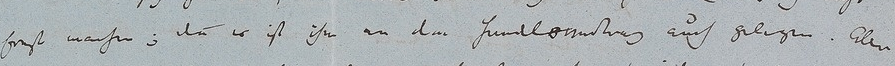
Ernst machen; denn es ist ihm an dem Handelsvertrag auch gelegen. Aber
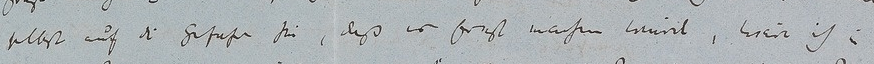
selbst auf die Gefahr hin, daß es Ernst machen wird, wäre ich in
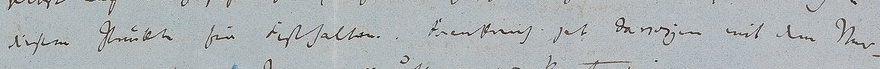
diesem Punkte für Festhalten. Frankreich hat Savoyen mit dem Ver-
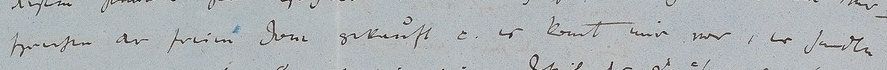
sprechen der freien Zone gekauft &. es kommt mir vor, es handle
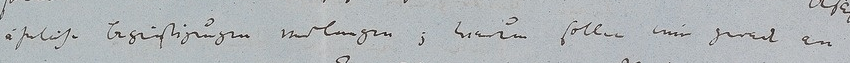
ähnliche Begünstigungen verlangen; warum sollen wir gerade an
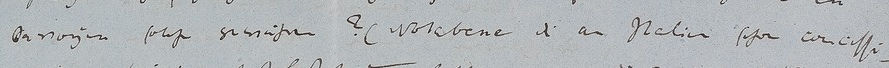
Savoyen solche gewähren? (Notabene die an Italien schon concessi-
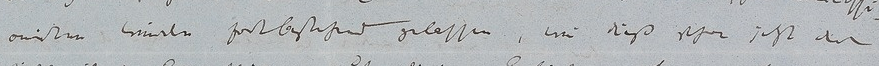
onirten würden fortbestehend gelassen, wie dieß schon jetzt der
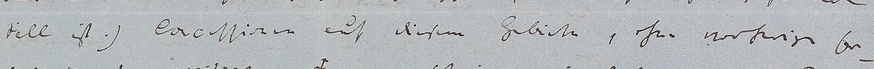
Fall ist.) Concessionen auf diesem Gebiete, ohne vorherige Er-
